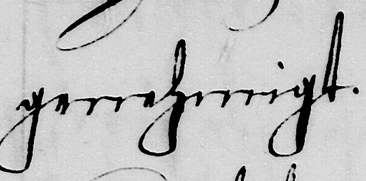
genehmigt.
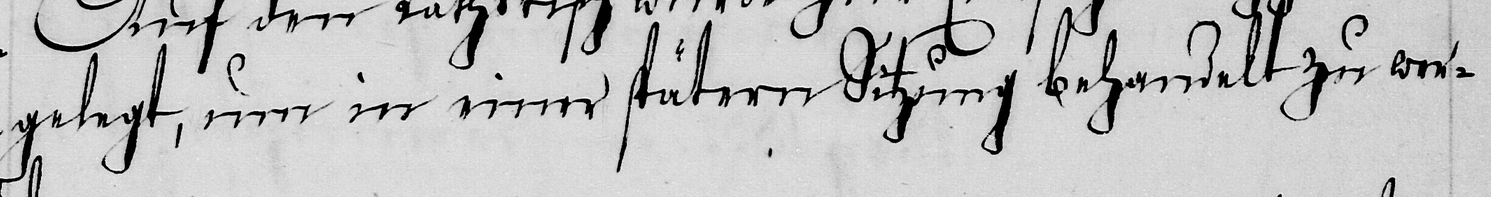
gelegt, um in einer spätern Sitzung behandelt zu wer¬
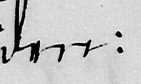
den:
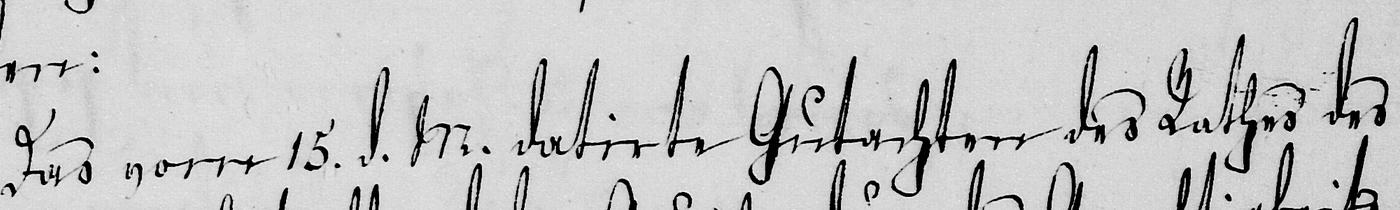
Das vom 15. d. M. datirte Gutachten des Rathes des
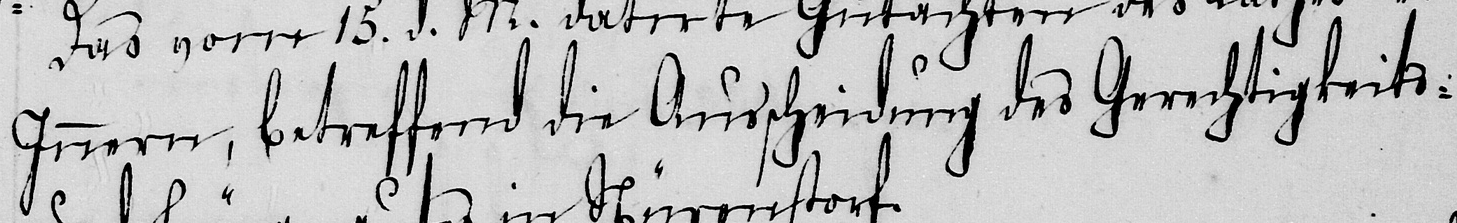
Innern, betreffend die Ausscheidung des Gerechtigkeits-
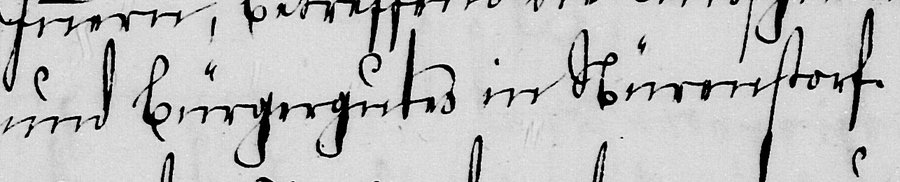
und Bürgergutes in Nürenstorf.
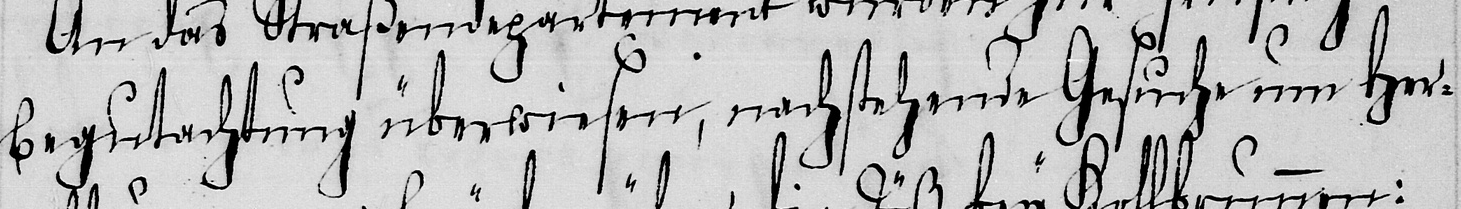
Begutachtung überwiesen, nachstehende Gesuche um Her¬
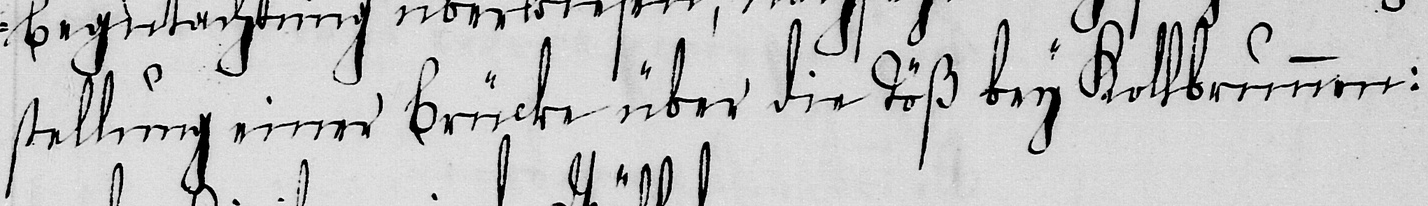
stellung einer Brücke über die Töß bey Kollbrunnen:
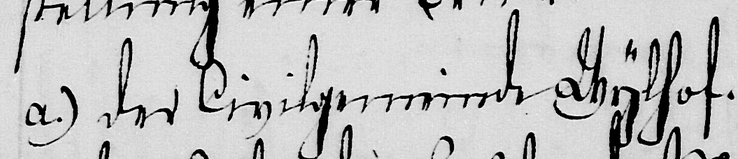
a.) der Civilgemeinde Wylhof.
